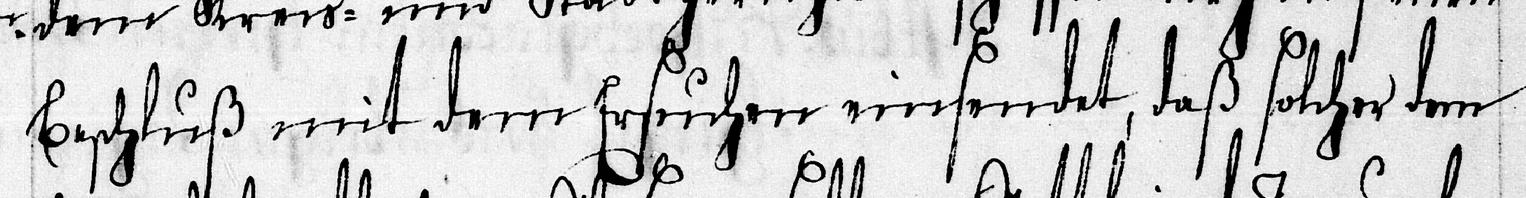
Beschluß mit dem Ersuchen einsendet, daß solcher dem
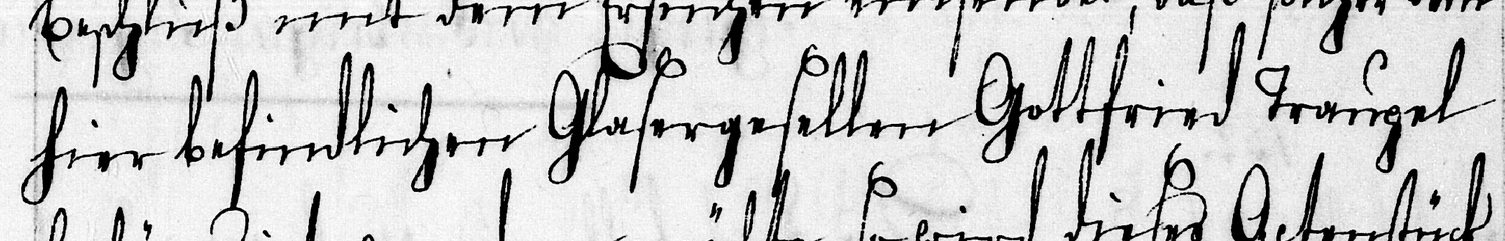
hier befindlichen Glasergesellen Gottfried Traupel
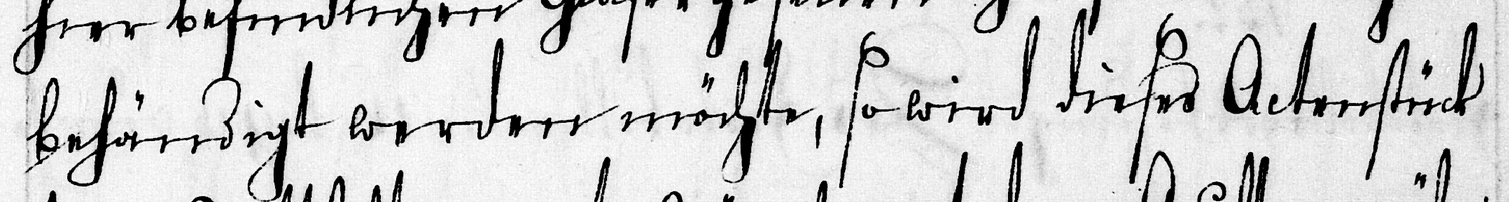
behändigt werden möchte, so wird dieses Actenstück
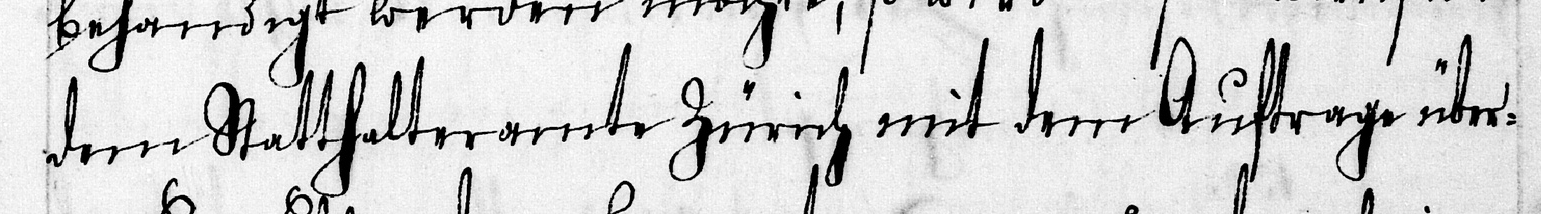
dem Statthalteramte Zürich mit dem Auftrage über¬
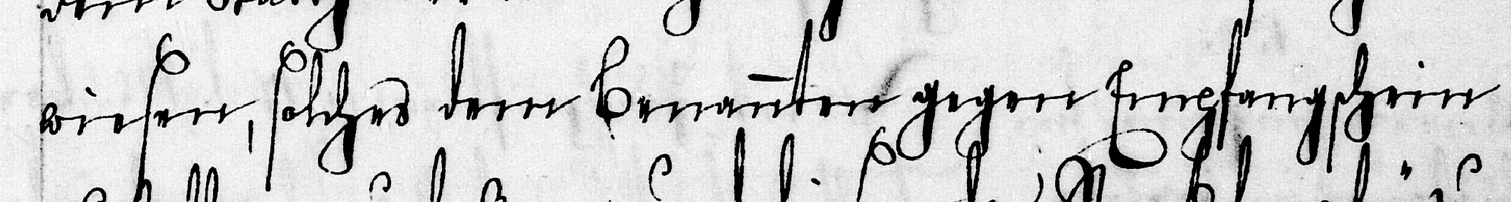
wiesen, solches dem Benannten gegen Empfangschein
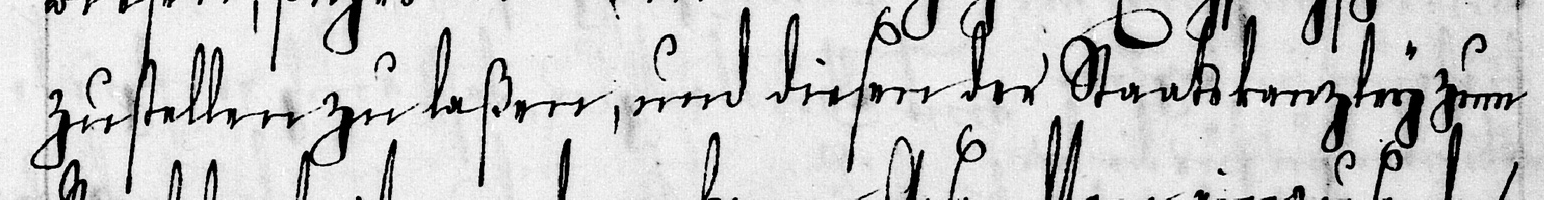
zustellen zu laßen, und diesen der Staatskanzley zum
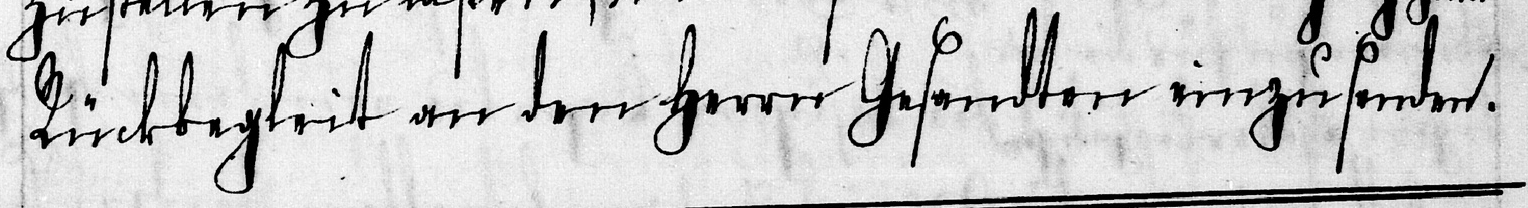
Rückbegleit an den Herrn Gesandten einzusenden.
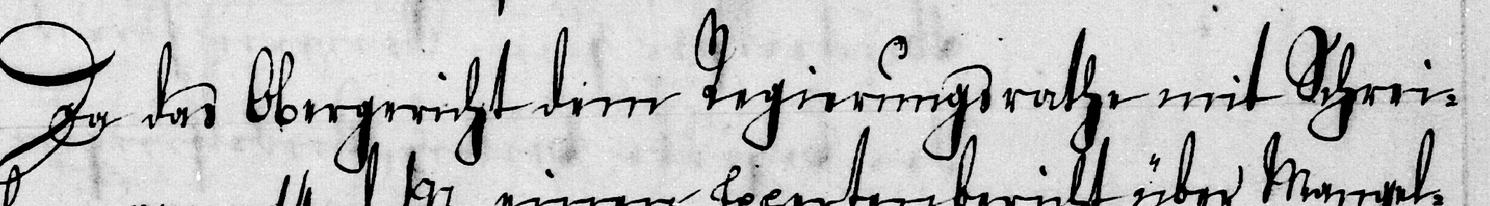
Da das Obergericht dem Regierungsrathe mit Schrei¬
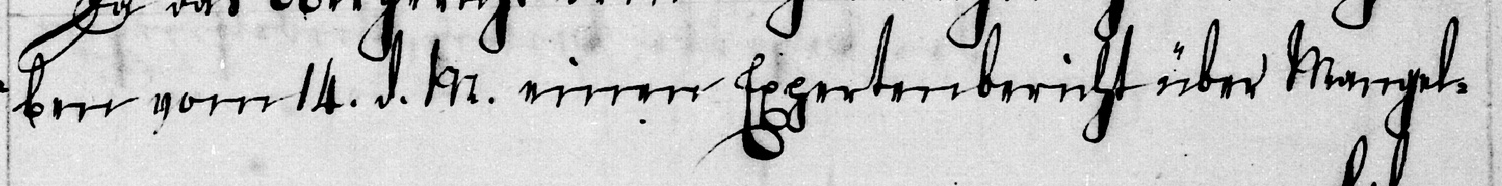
ben vom 14. d. M. einen Expertenbericht über Mangel-
